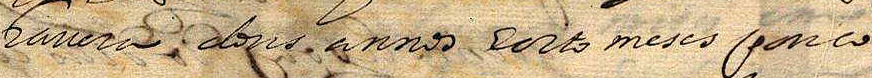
hauera dous annos E oito meses pouco
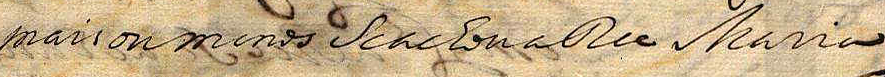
mais ou menos se achou a Ree Maria
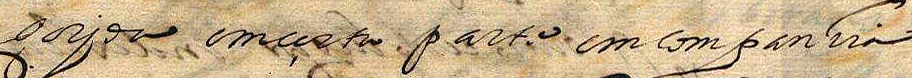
gorjoa em certa parte em companhia
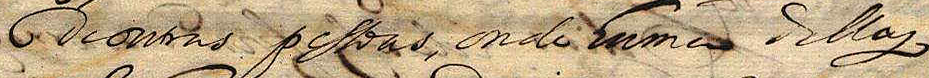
de outras pessoas, onde huma dellas
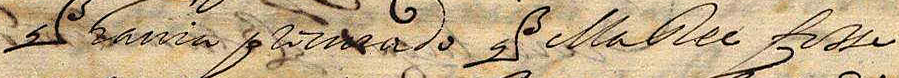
q̄ hauia precurado q̄ ella Ree fosse
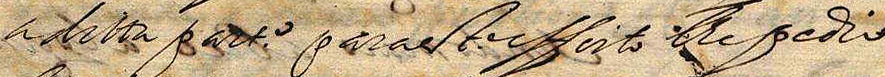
a ditta parte para este effeito lhe pedio
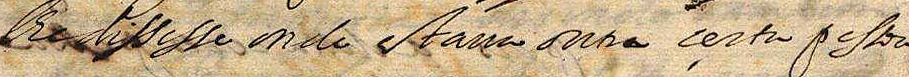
lhe dissesse onde estaua outra certa pessoa
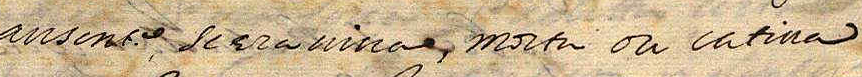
ausente, se Era uiua, morta ou catiua
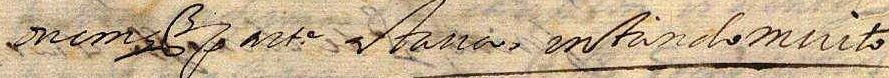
ou em q̄ parte estaua, instando muito
